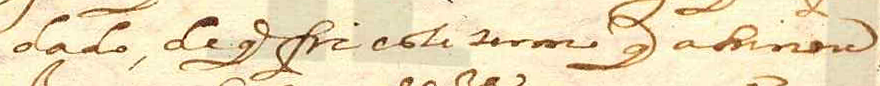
dado, de q̄ fiz este termo q̄ assinou
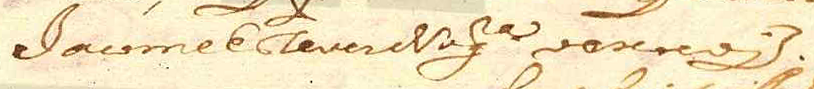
Iacome Esteves Nogra o escrevj.
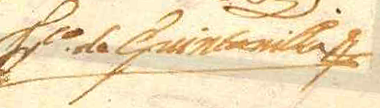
Frco de Quintanilha
